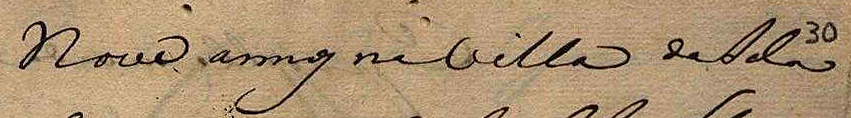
Nove annos na villa de Ida
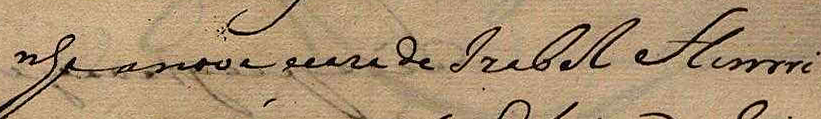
nha a nova e caza de Izabel Henrri
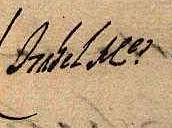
Izabel H.es
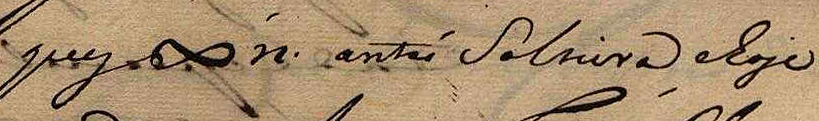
ques xn. antaõ Solteira, e hoje
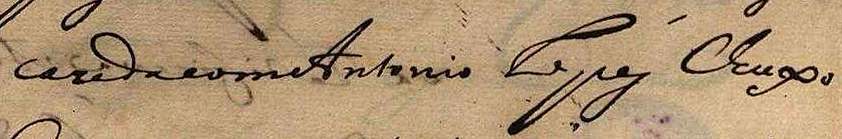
cazada com Antonio Lopes Chuxo
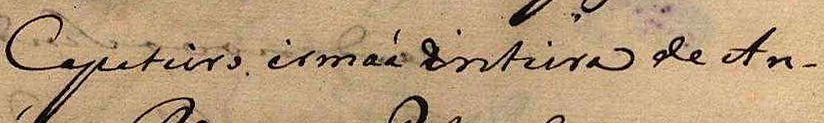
Çapateiro irmaã inteira de An
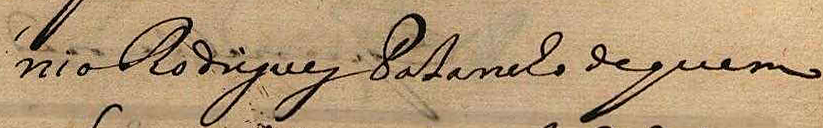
nio Rodrigues Palancho de quem
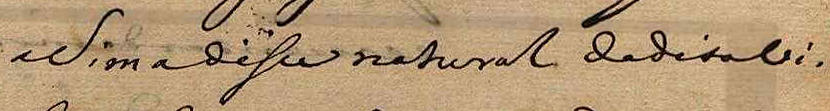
aSima disse natural da dita vi
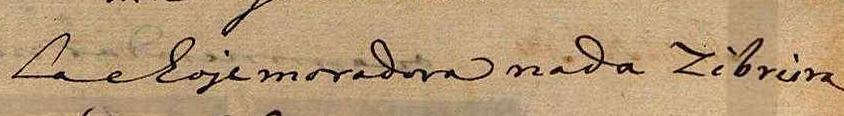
La e hoje moradora na da Zibreira
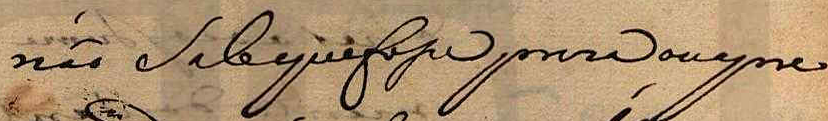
não Sabe que fosse preza, ou apre
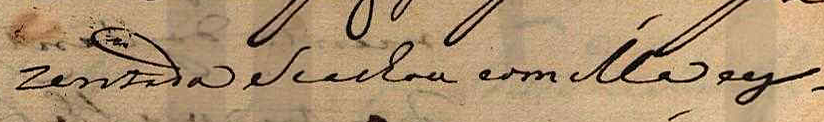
zentada, se achou com ella e es
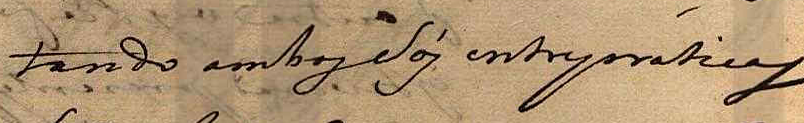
tando ambos sós entre praticas
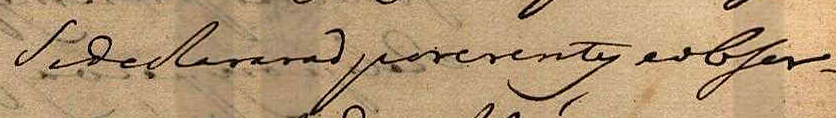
se declararaõ por crentes e obser
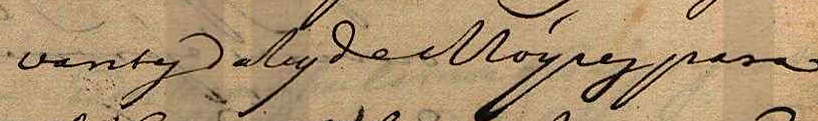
vantes da ley de Moyzes para
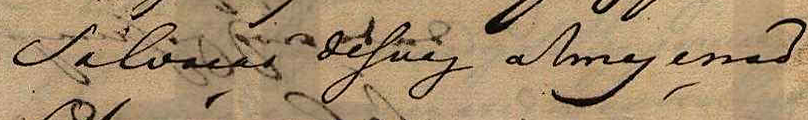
Salvaçaõ de suas almas e naõ
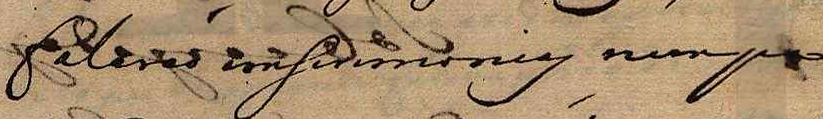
falaraõ em seremonias nem pa
